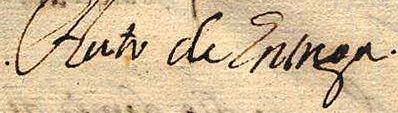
Auto de Entrega.
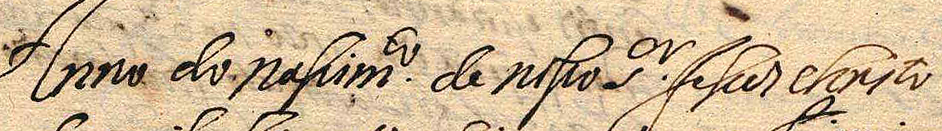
Anno do nassimto. de nosso sor. Jesus christo
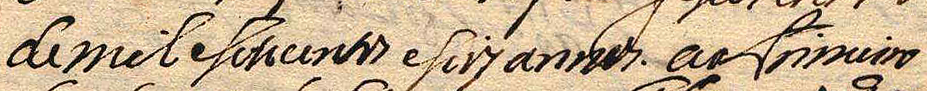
de mil e setecentos e seis annos. ao Primeiro
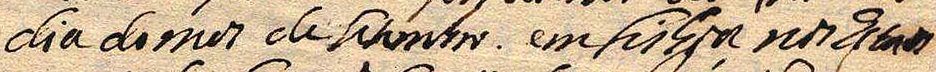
dia do mes de setembro. em Lisboa nos Estaos
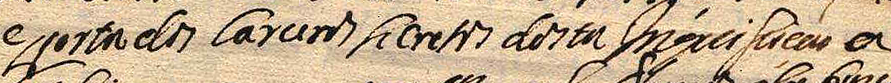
e porta dos Carceres secretos desta Inquisição a
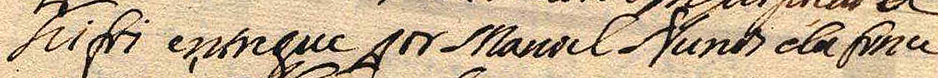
hi foi entregue por Manoel Nunes da fonce
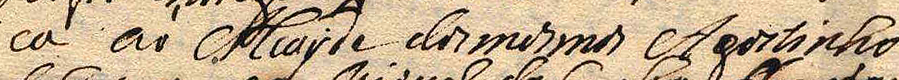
ca ao Alcayde dos mesmos Agostinho
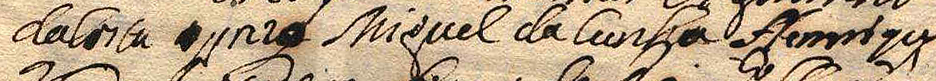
da Costa o prezo Miguel da Cunha Henriques
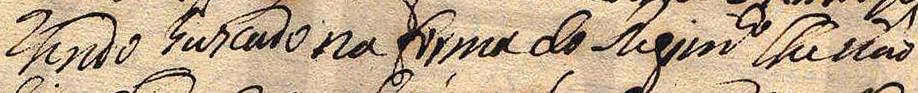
E sendo buscado na forma do Regimto lhe não
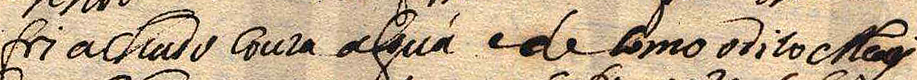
foi achado couza alguā e de como o dito Alcay
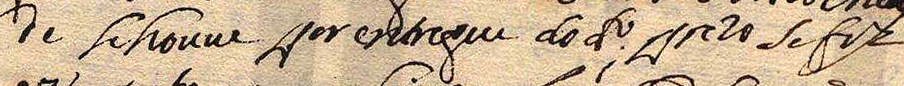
de se houue por entregue do d̄.o prezo se fez
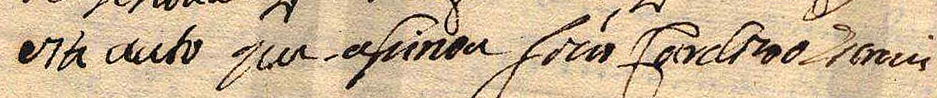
este auto que assinou João Cardozo o Escreui
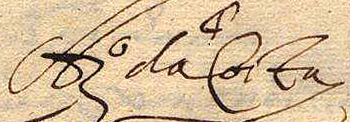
Ago da Costa
